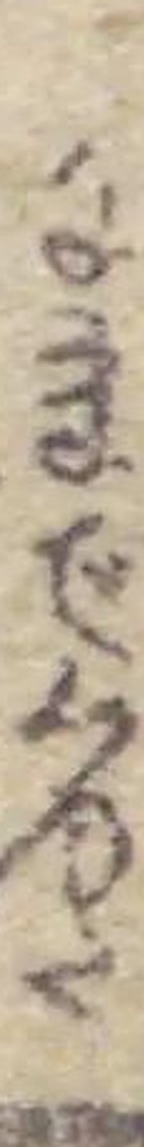なまでくつた
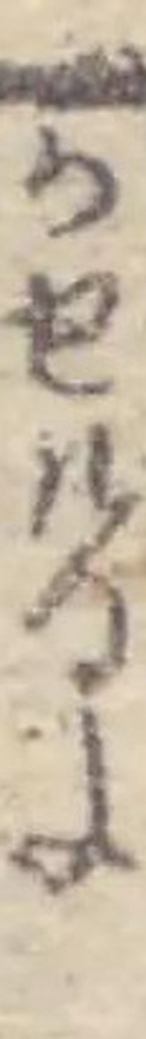かせけるに
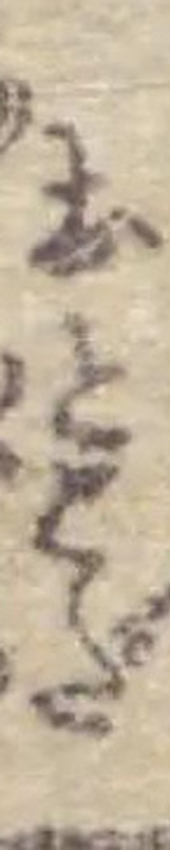おとこだ
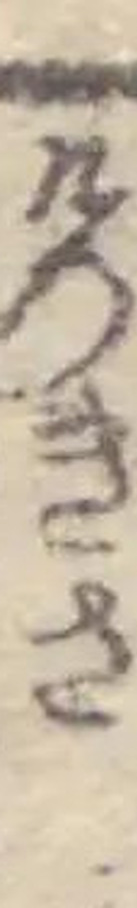けつきさ
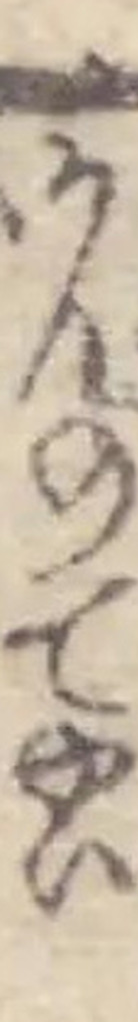かんのてやい
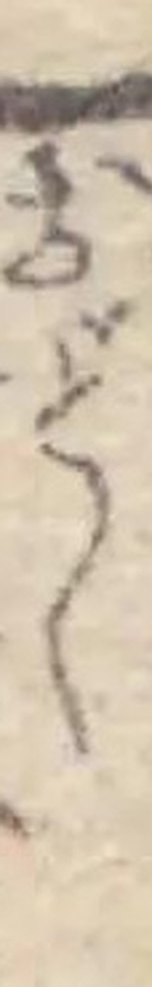おどし
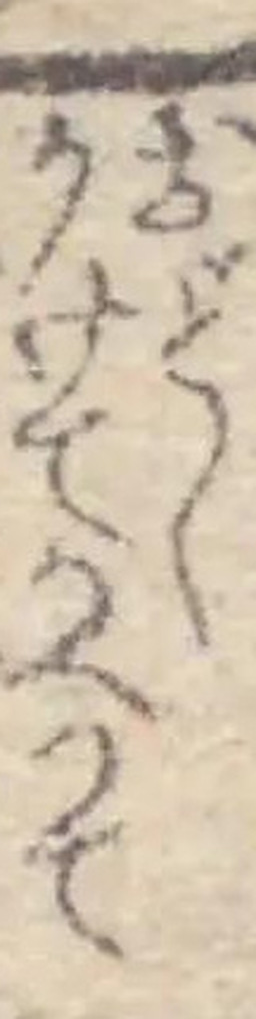かけてかへつて
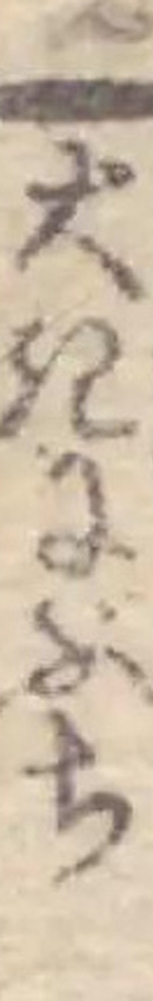大きにぶち
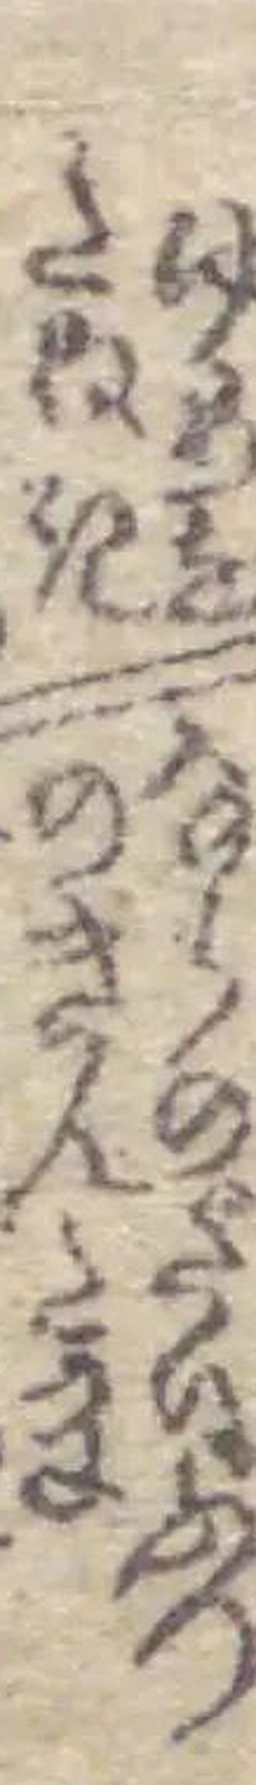たぬきのきんたま
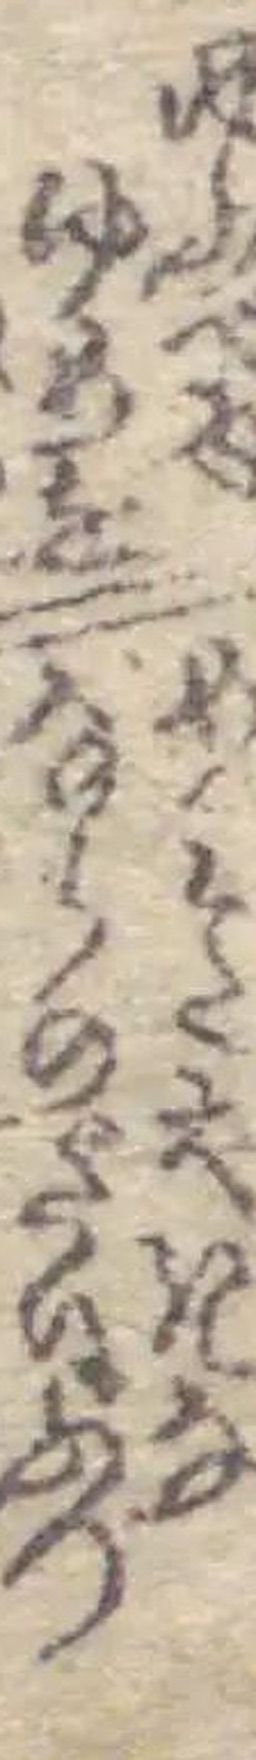ゆめをならのだいぶつ
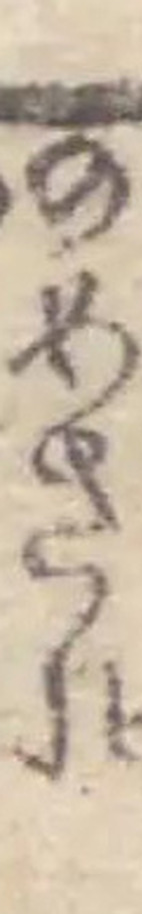のめされ
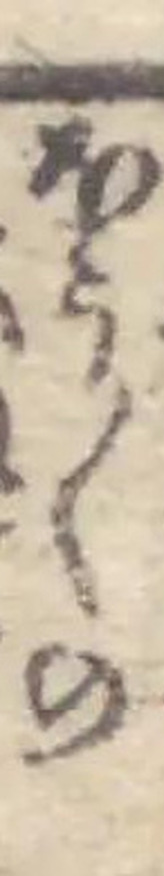ほう〳〵の
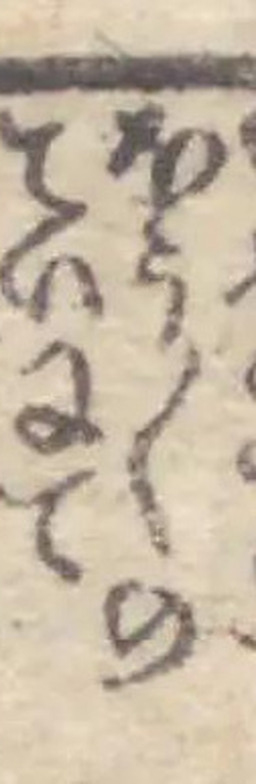ていにて
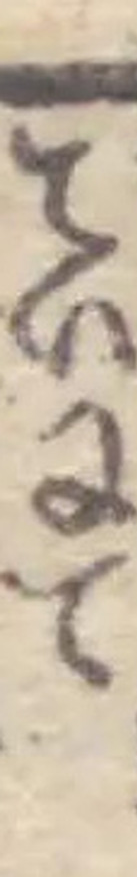ていにて
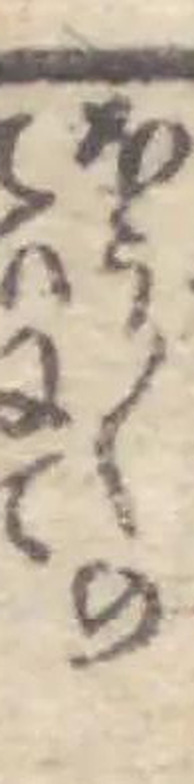ほう〳〵の

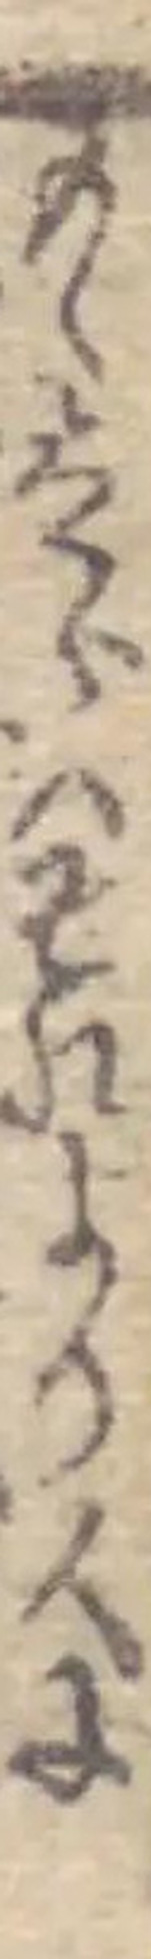もゝ太郎はそれより人に
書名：化物尽 4巻
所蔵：国立国会図書館 National Diet Library, JAPAN
